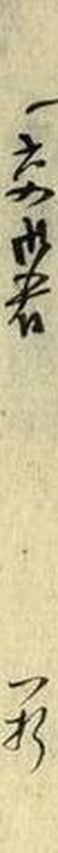交御肴一折
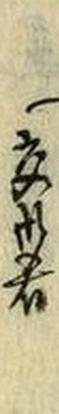交御肴一折
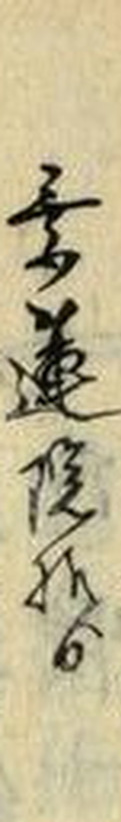乗蓮院様ゟ
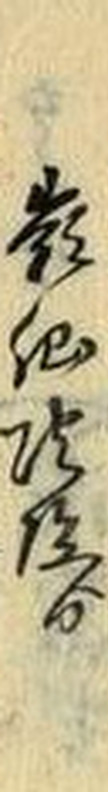嶺仙院殿ゟ
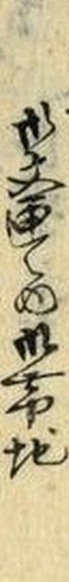御文匣之内御帯地五
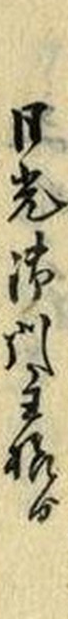日光御門主様ゟ
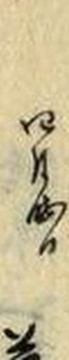四月晦日
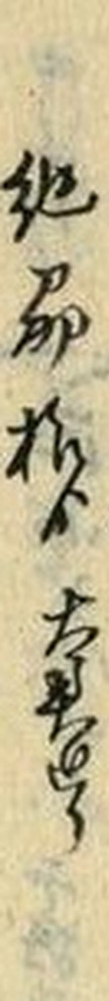紀州様ゟ大奥廻り
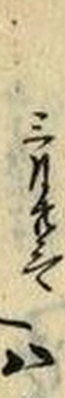三月廿四日
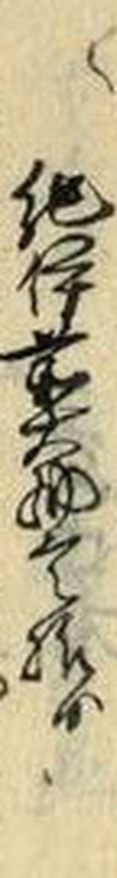紀伊前大納言様ゟ
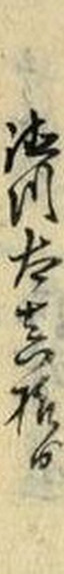徳川太真様ゟ
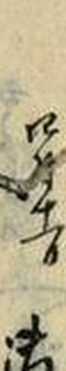四月十一日

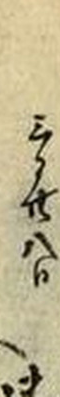三月廿八日
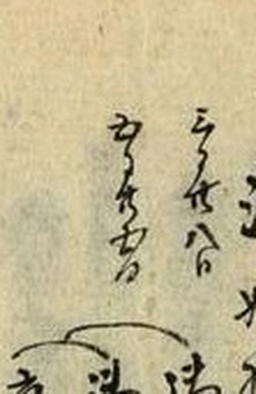五月廿五日
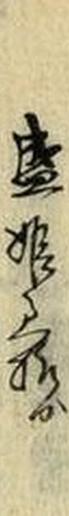盛姫君様ゟ
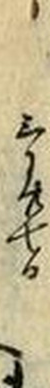三月廿七日
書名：少傅日録抄（斉承付側向頭取日記、在府）
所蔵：福井県文書館 Fukui Prefectural Archives
